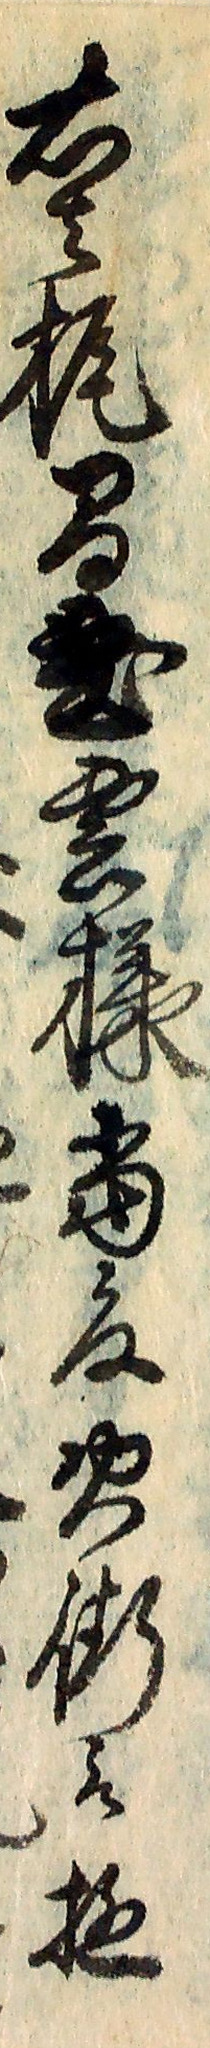右は梶間出雲様当夏火術被遊
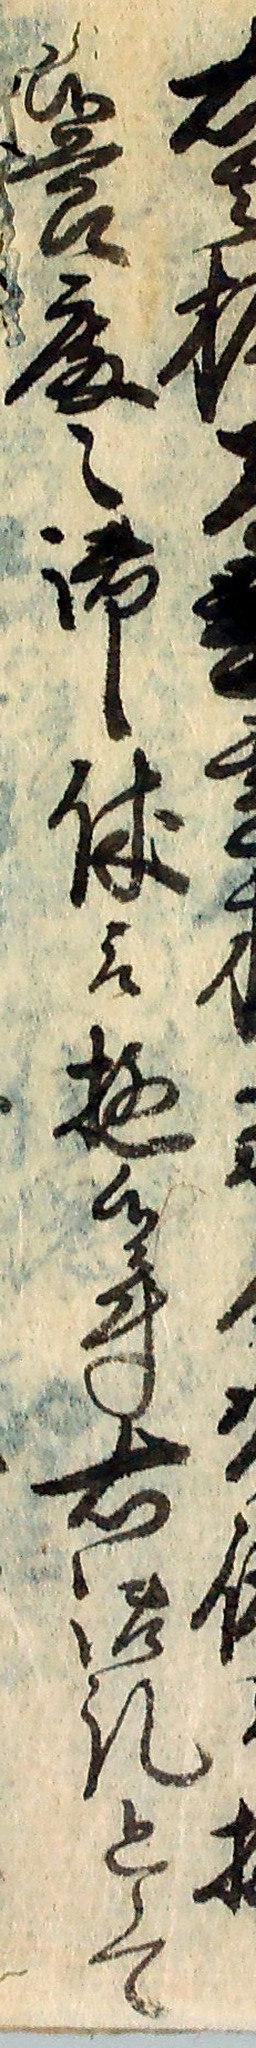候節度々御休被遊候付右御礼として
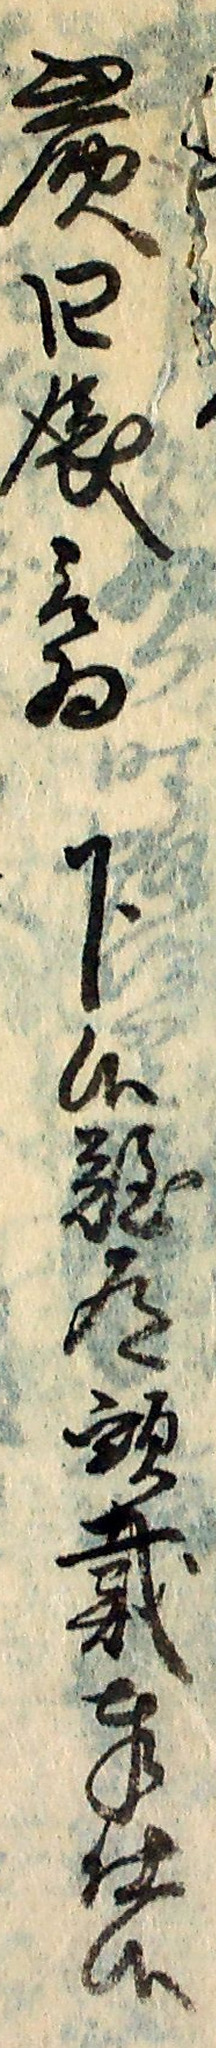炭四俵被為下候難有頂戴奉仕候
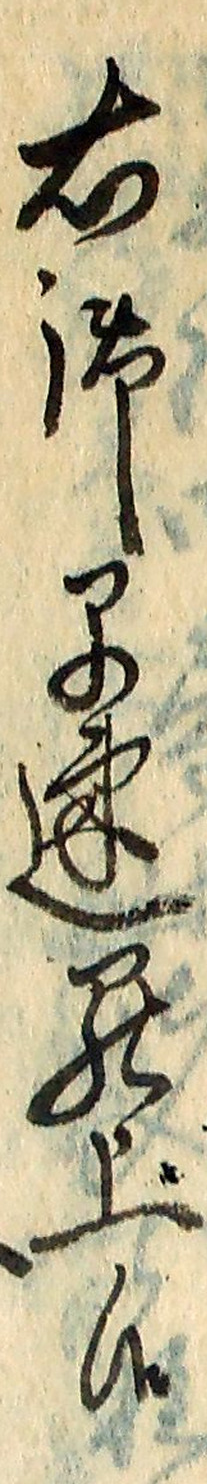右御早速罷上候
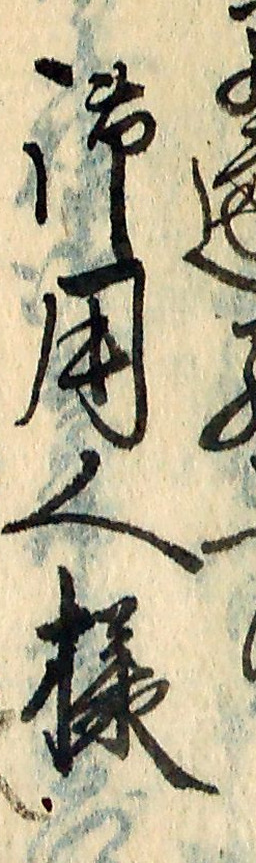御用人様
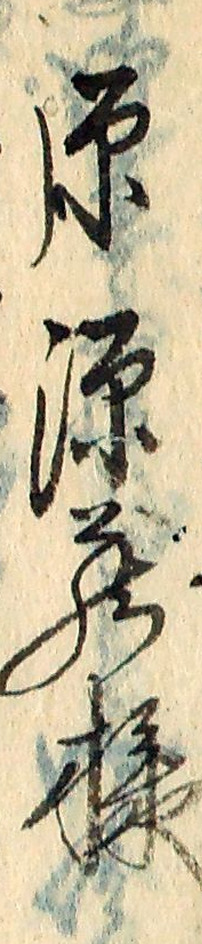原源蔵様
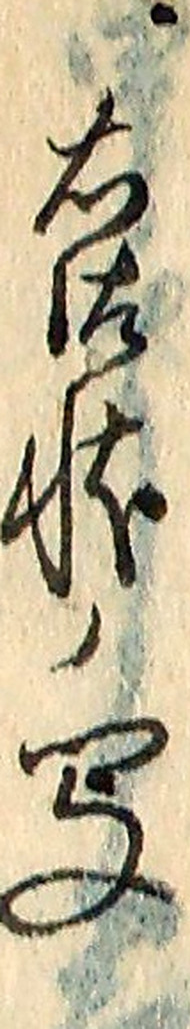右御状ノ写
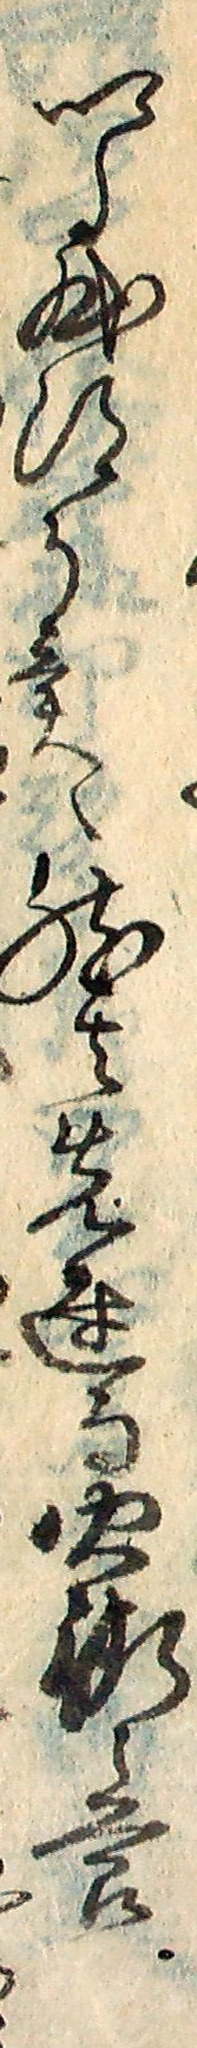以手紙得御意候然は先達て火術之節
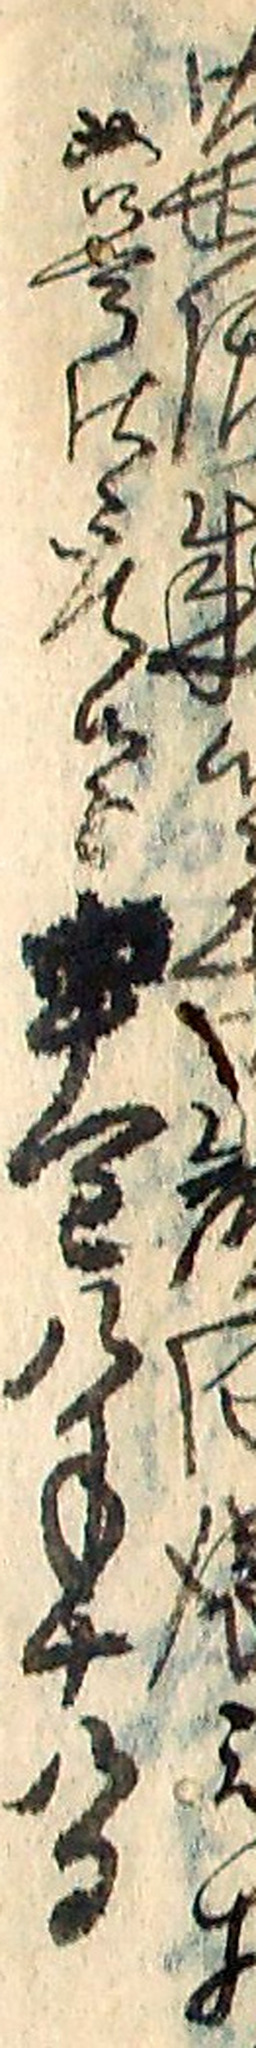如是御座候以上申閏八月十八日

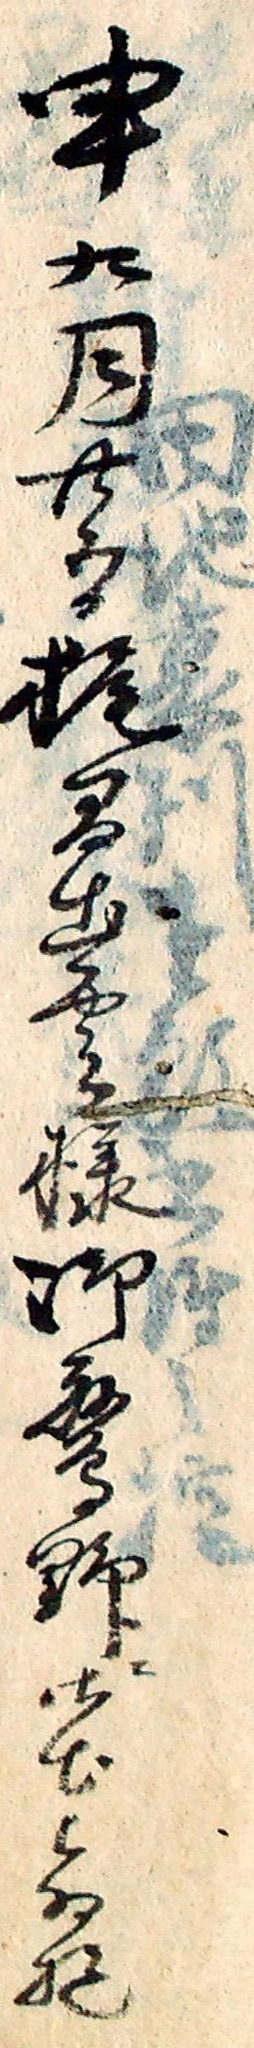申九月廿五日梶間出雲様御鷹野に御出被為遊
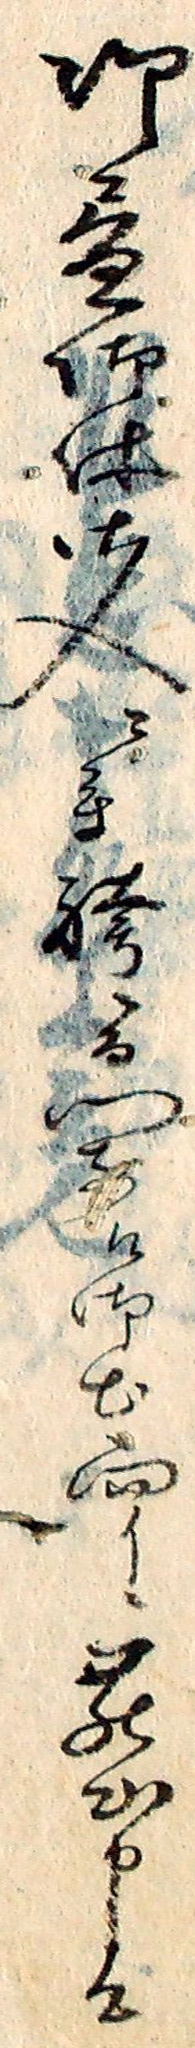御昼御休御入に付袴にて門前え御出向いに罷出申候
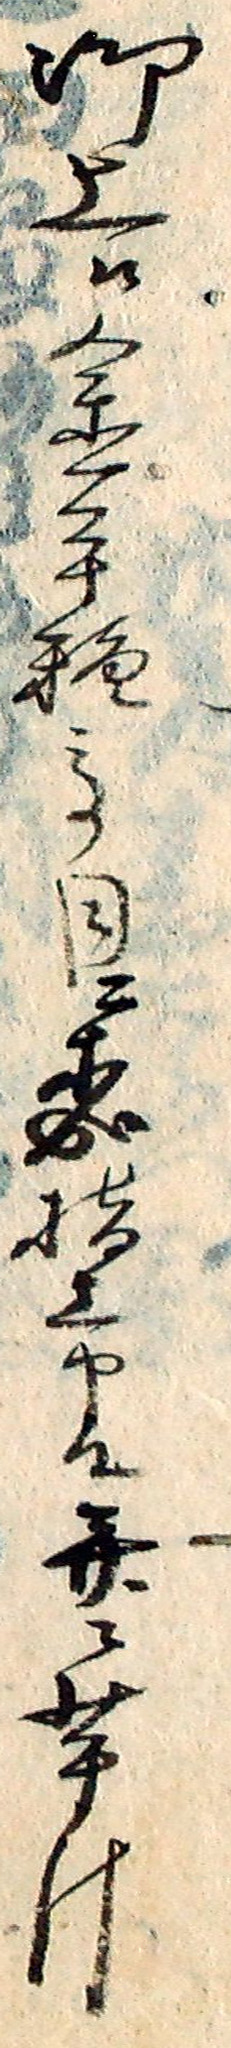御上え金平糖高月に森指上申候并に芋汁
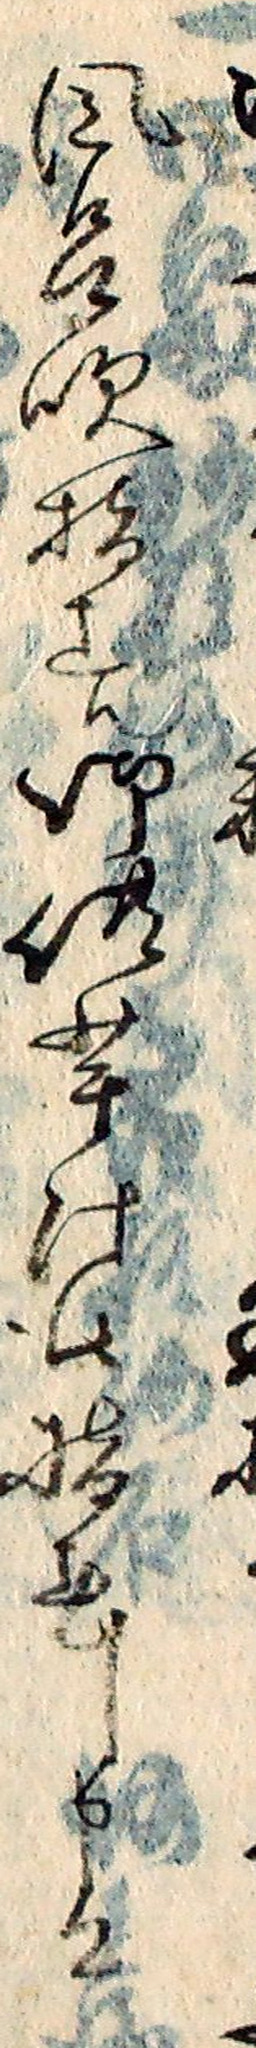風呂吹指上る御供芋汁仕指出し申候
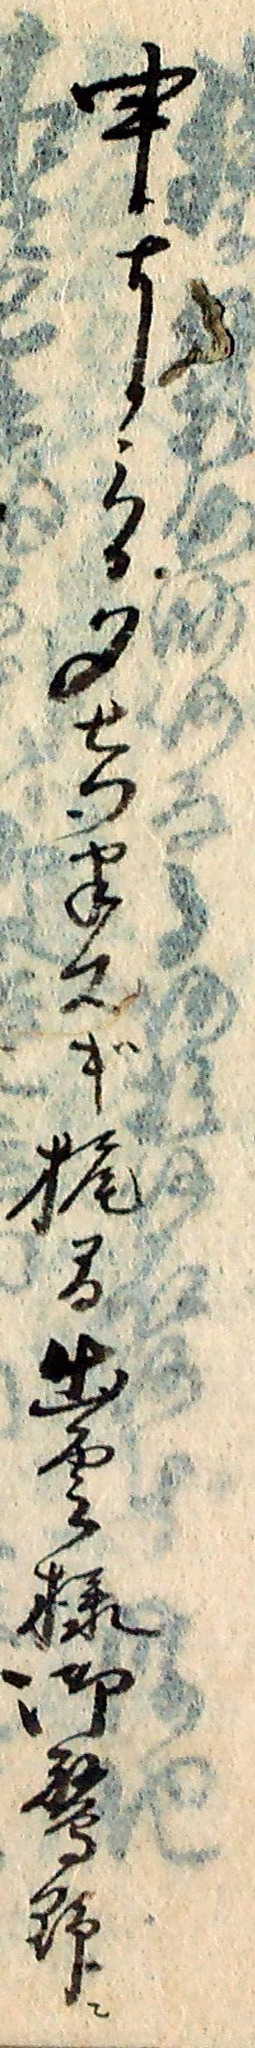申十月三日夕七つ半すぎ梶間出雲様御鷹野に
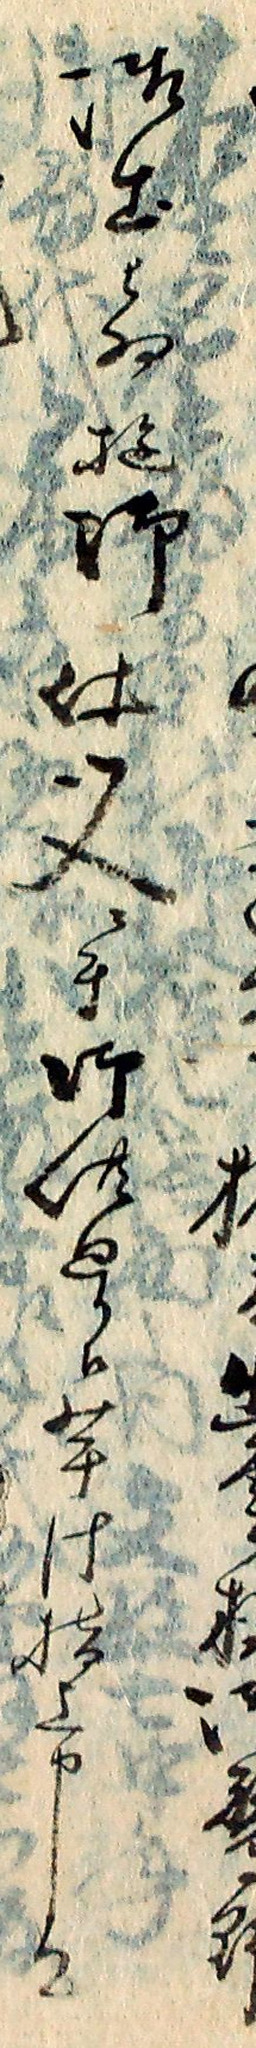御出被為遊御休御入に付御供廻りえ芋汁指上申候
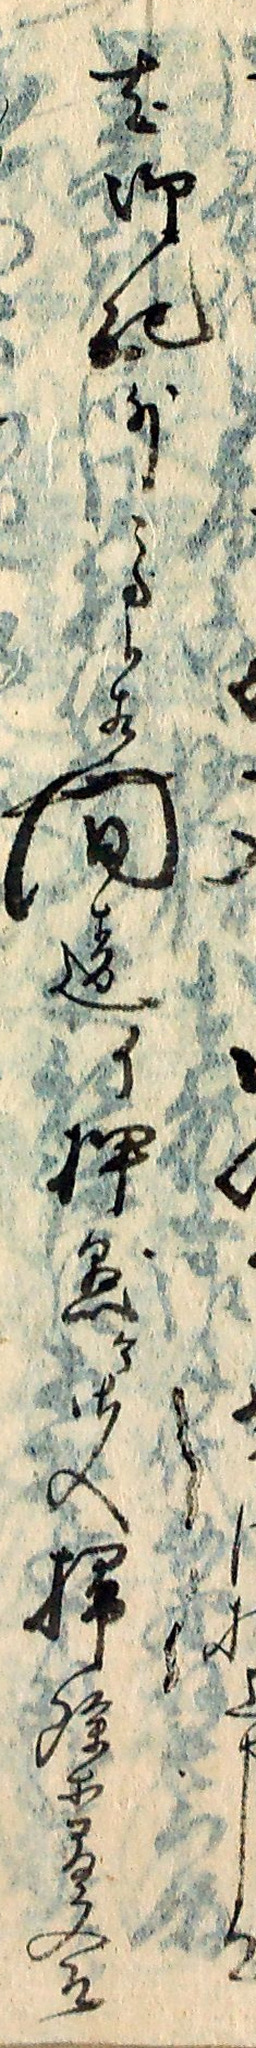尤御配外方え相間違い押懸け御入掃除等間に合
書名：諸御願書控(後藤氏壱番）
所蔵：鳴門教育大学 Naruto University of Education
